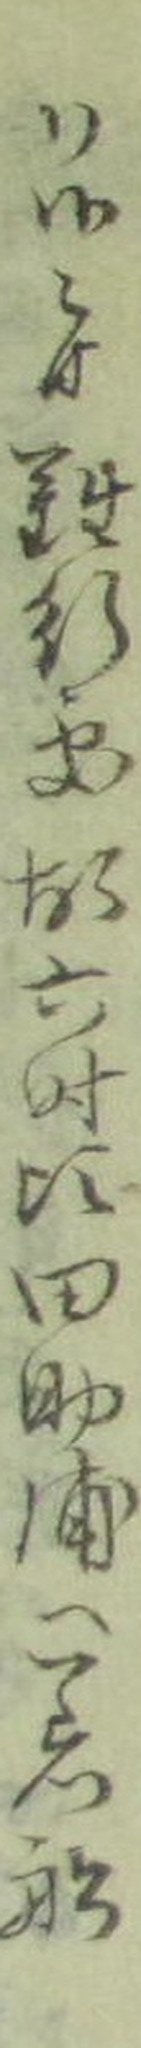り候に付難行処故六時頃田助浦へ着船
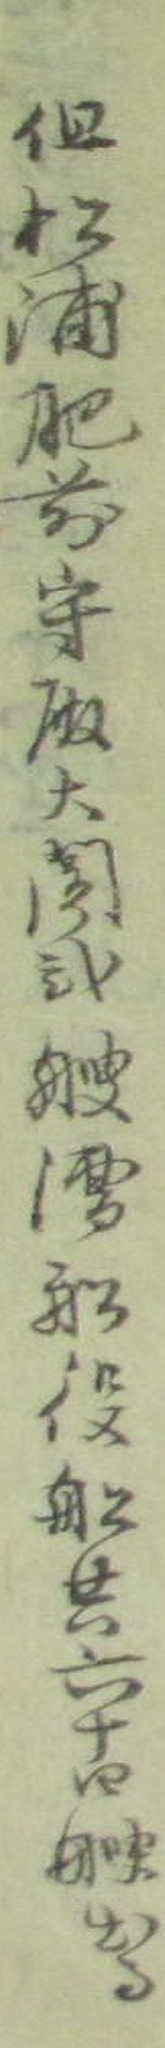但松浦肥前守殿大関弐艘漕船役船共六十四艘出る

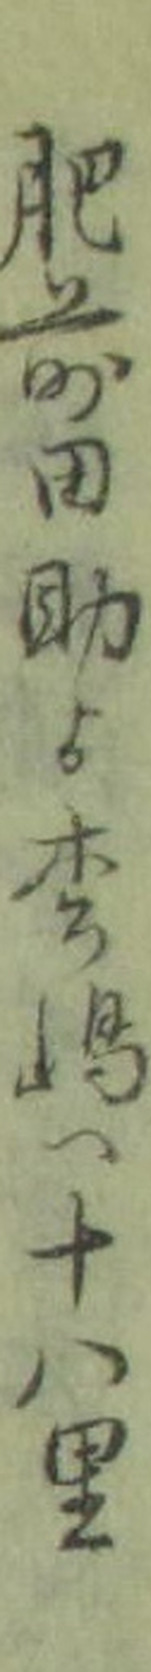肥前田助ゟ松嶋へ十八里
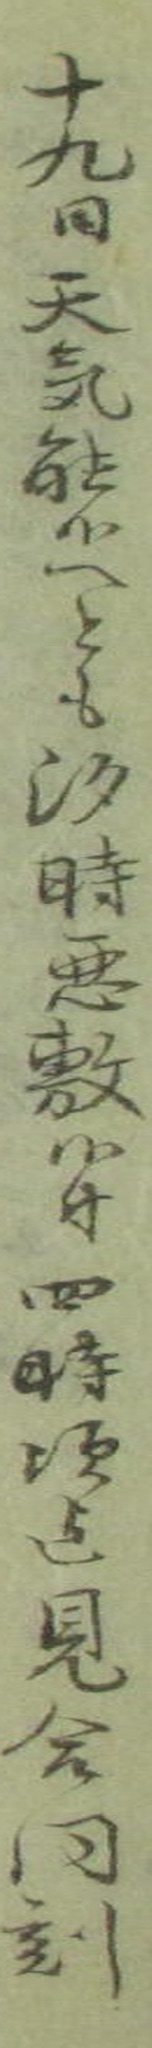十九日天気能候へとも汐時悪敷候付四時頃迄見合同刻
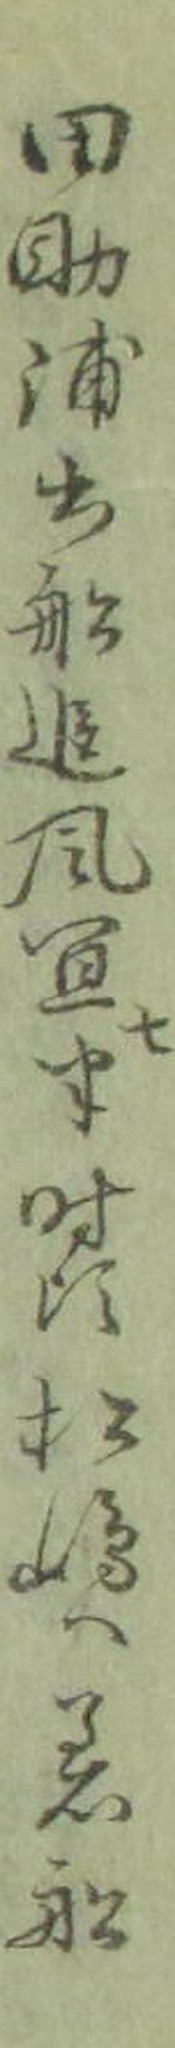田助浦出船追風宜七半時頃松嶋へ着船
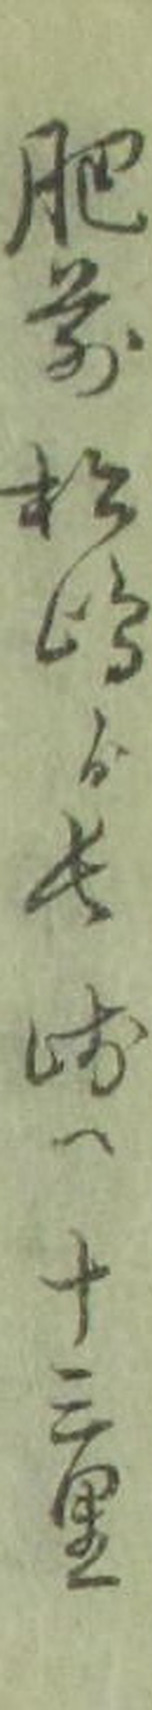肥前松嶋ゟ長崎へ十三里
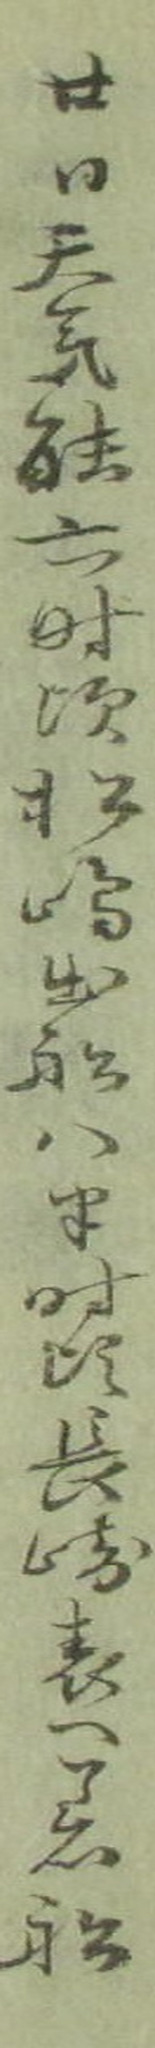廿日天気能六時頃松嶋出船八半時頃長崎表へ着船
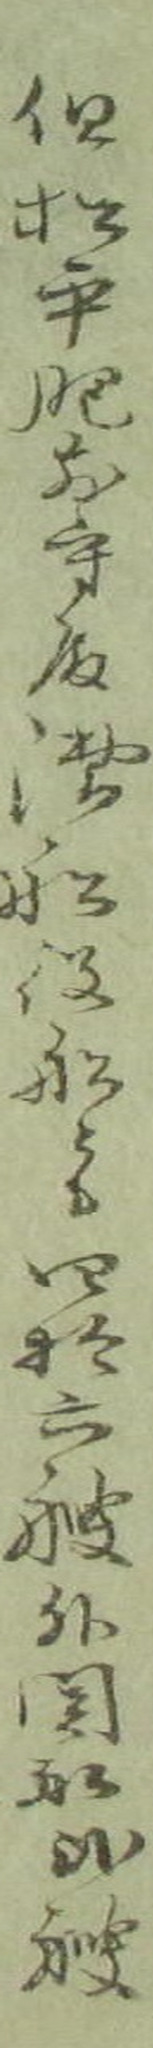但松平肥前守殿漕船役船とも四拾六艘外関船弐艘
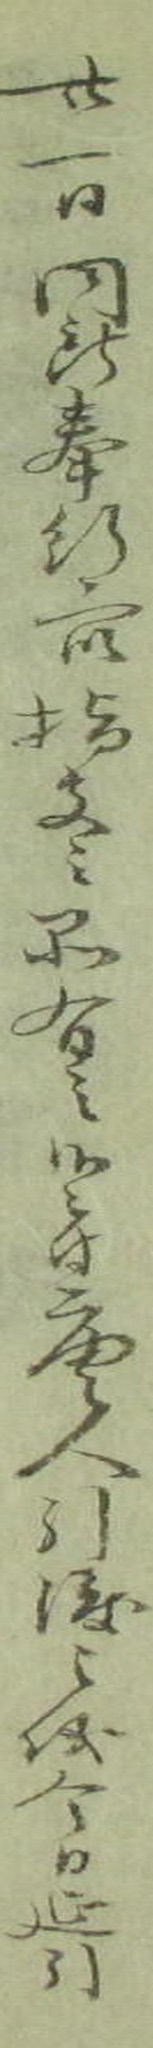廿一日同所奉行衆指支之品有之候に付唐人引渡之儀今日延引
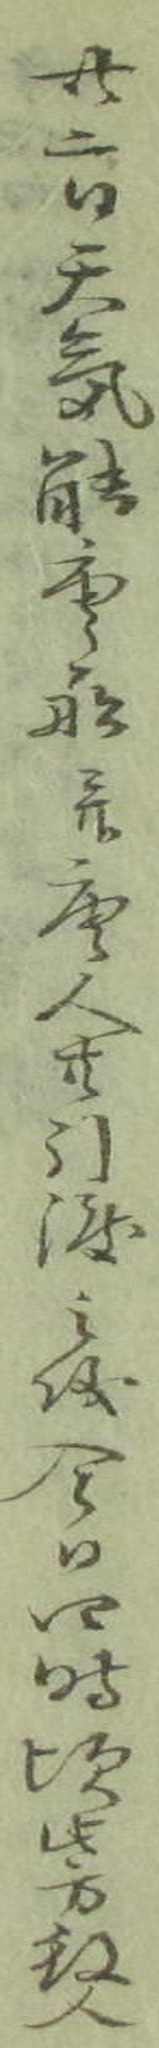廿二日天気能唐船幷唐人共引渡之儀今日四時頃此方数人
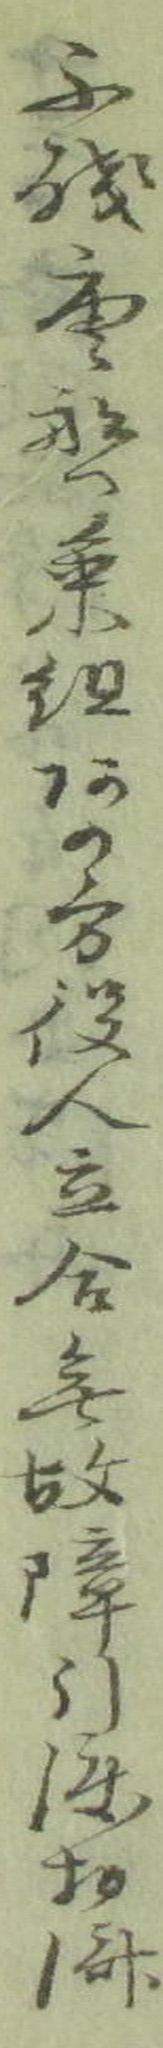不残唐船へ乗組あの方役人立合無故障引渡相済
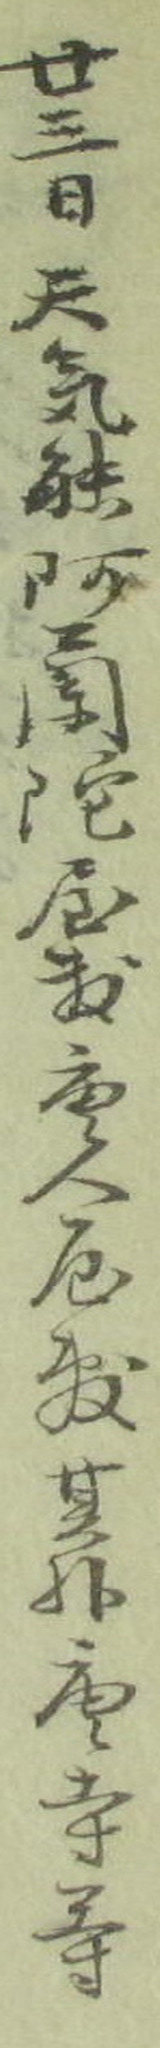廿三日天気能阿蘭陀屋敷唐人屋敷其外唐寺等
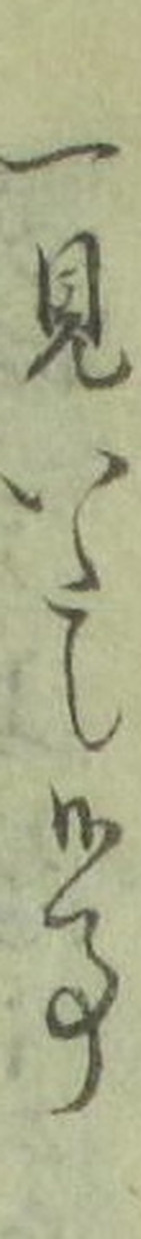一見いたし候事
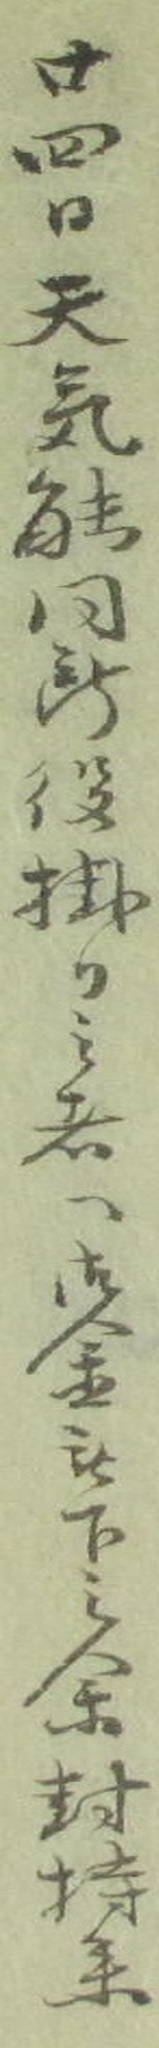廿四日天気能同所役掛り之者へ御金被下之余封持参
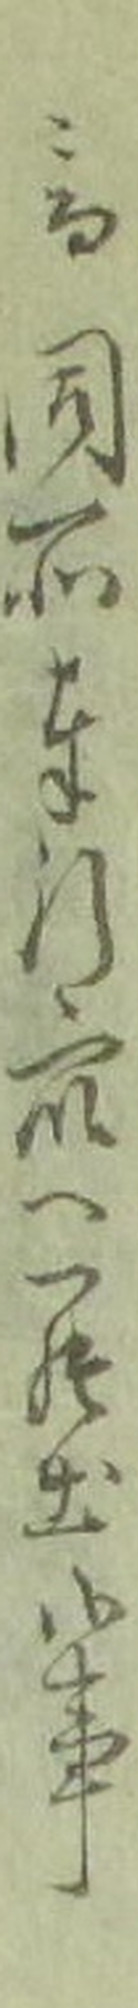に而同所奉行衆へ罷出候事
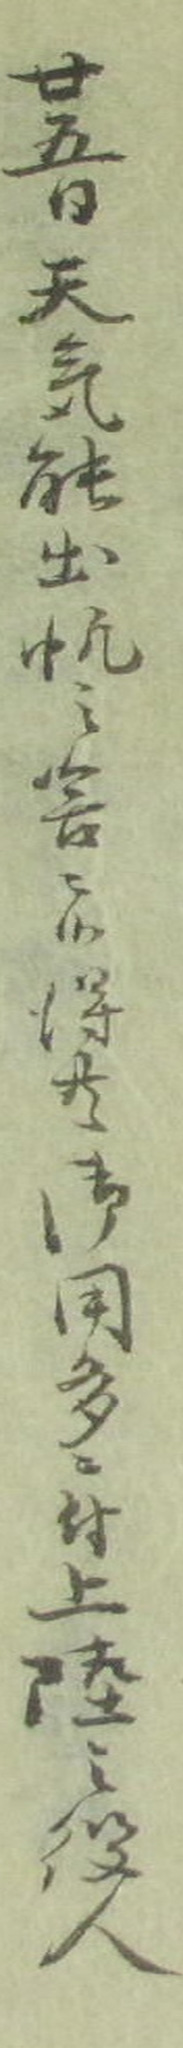廿五日天気能出帆之筈に候得共御用多に付上陸之役人
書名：紀州九木浦庄屋記録 四
